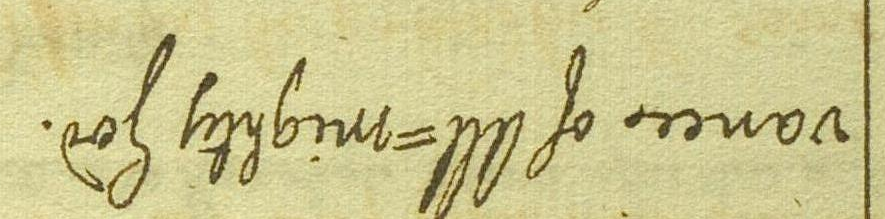vance of All-mighty God.
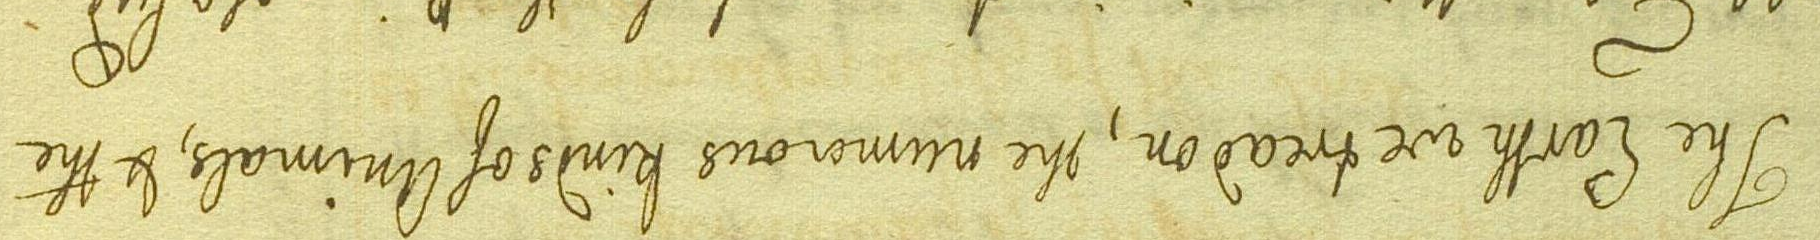The Earth we tread on, the numerous kinds of Animals, & the
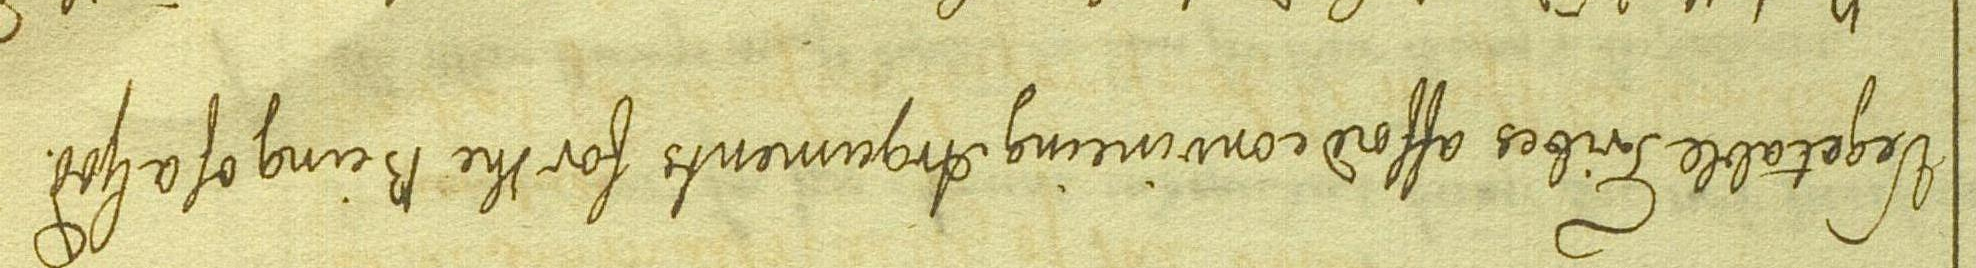Vegetable Tribes afford convincing Arguments for the Being of a God.
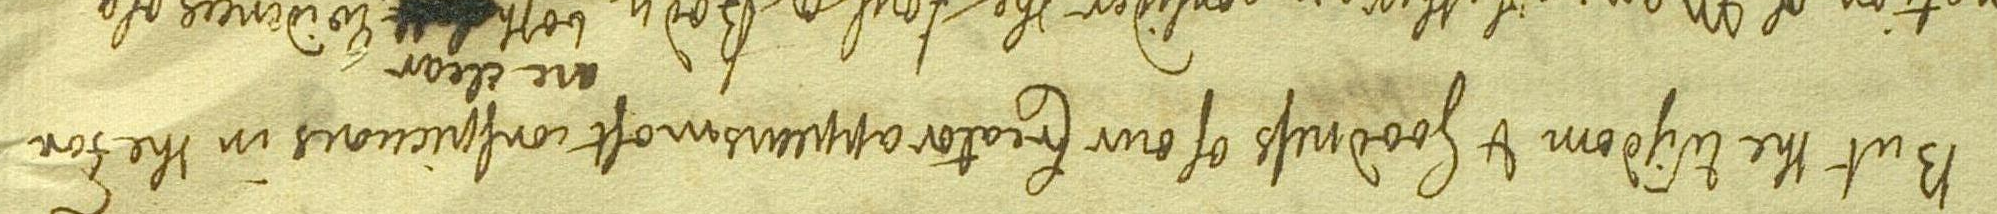But the Wisdom & Goodness of our Creator appears most conspicuous in the For-
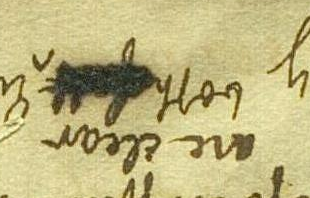are clear
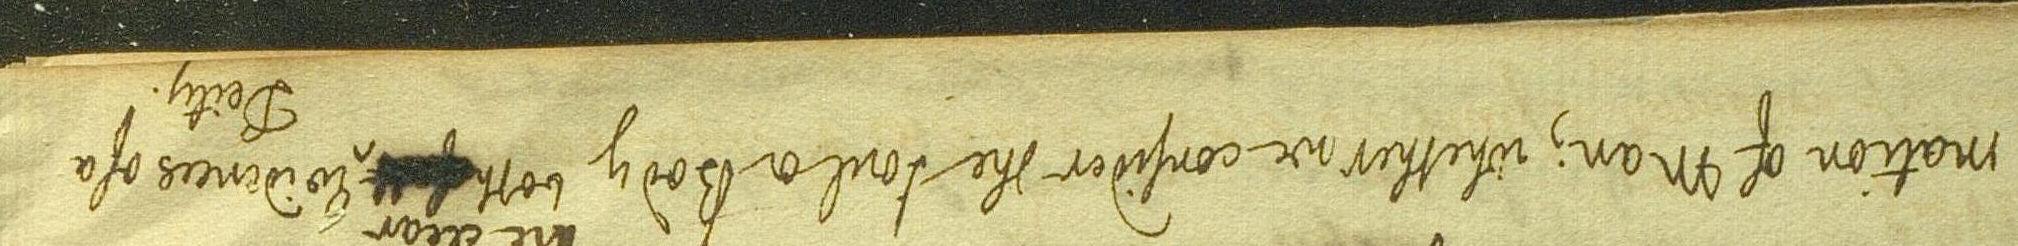mation of Man; whether we consider the Soul or Body both [____] ^ wideness of a
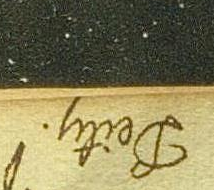Deity.
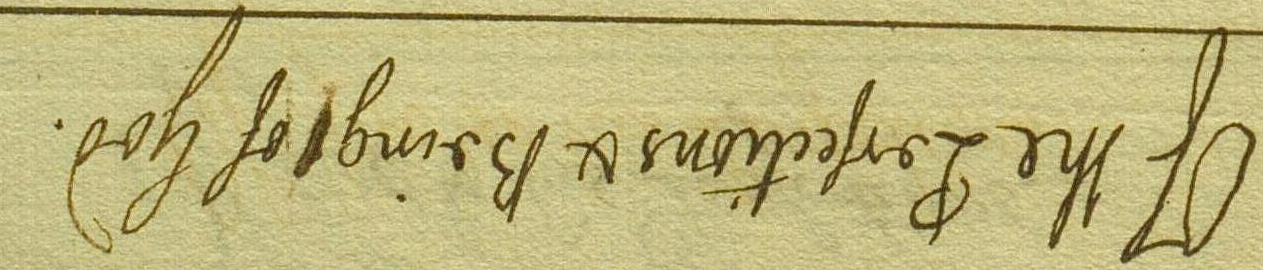Of the Perfections & Being[_] of God.
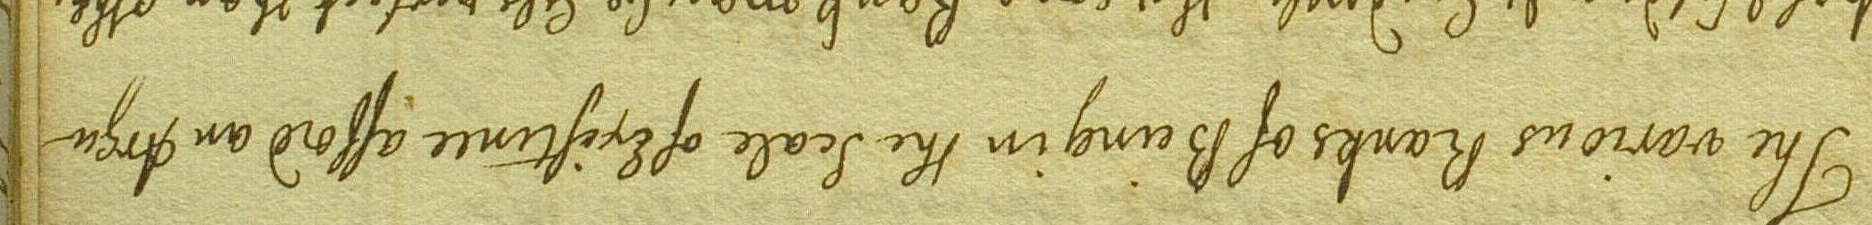The various Ranks of Being in the Scale of Existence afford an Argu-
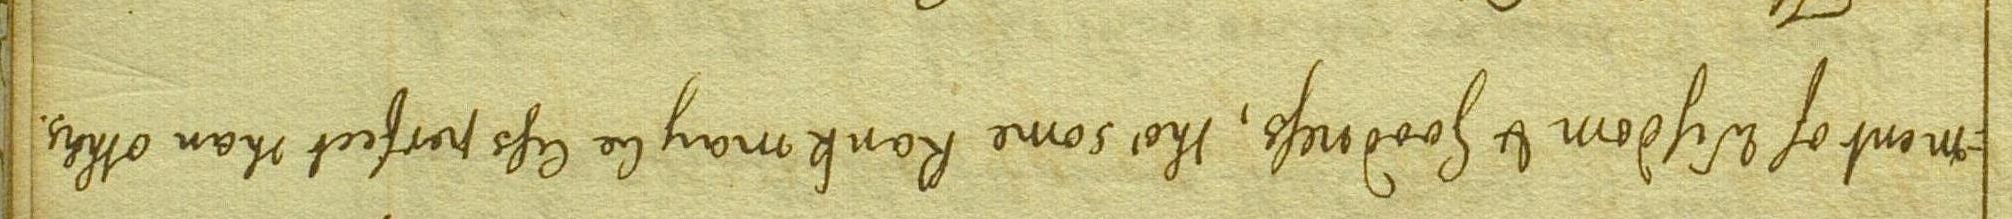-ment of Wisdom & Goodness, tho' some Rank may be less perfect than others.
